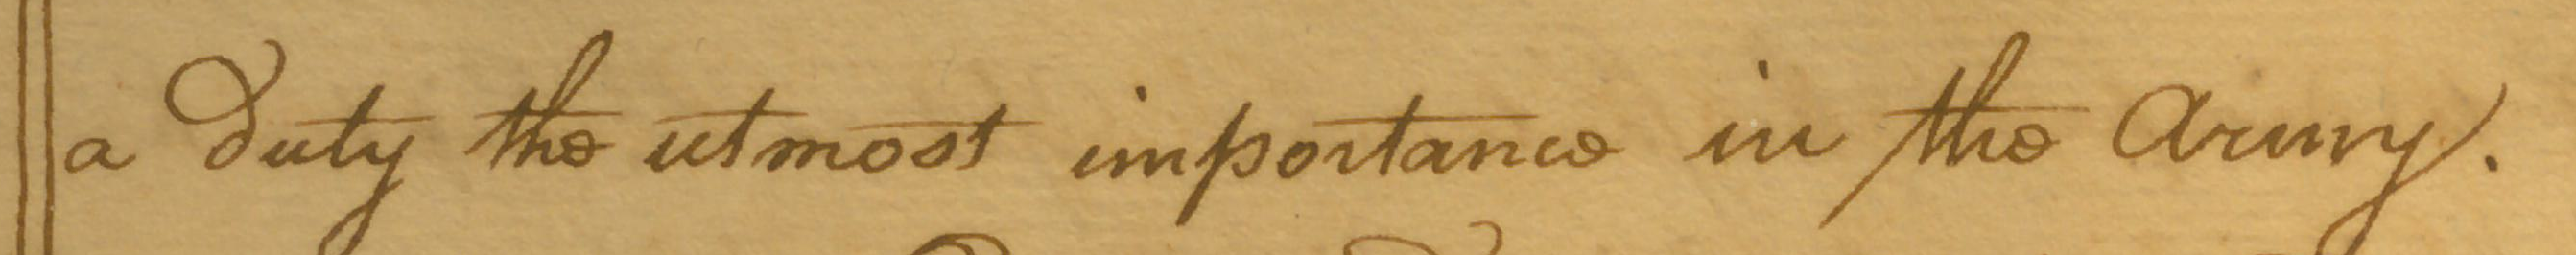a duty the utmost importance in the Army.
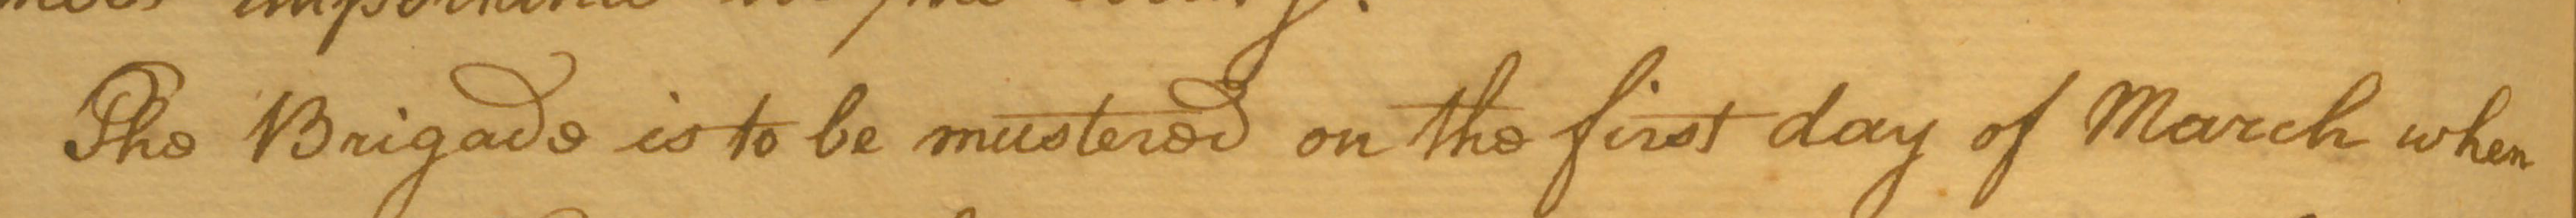The Brigade is to be mustered on the first day of March when
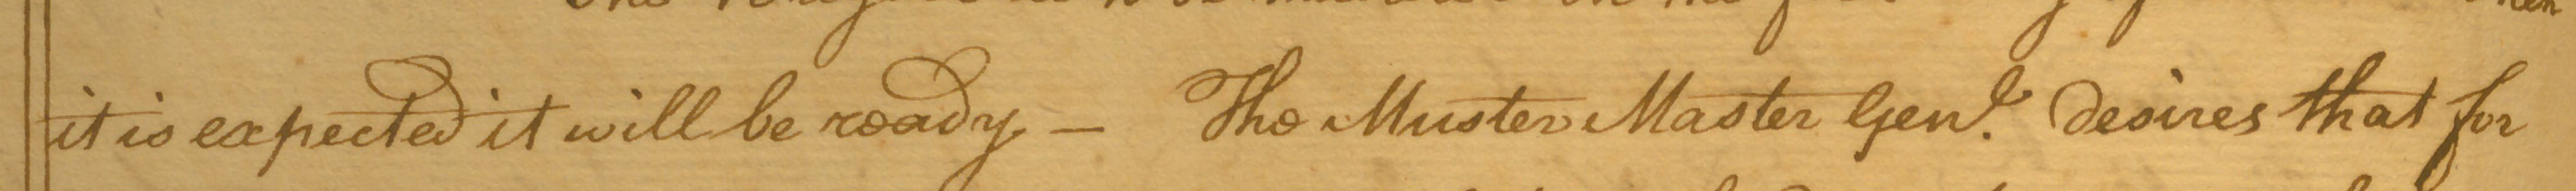it is expected it will be ready- The Muster Master Gen^l. desires that for
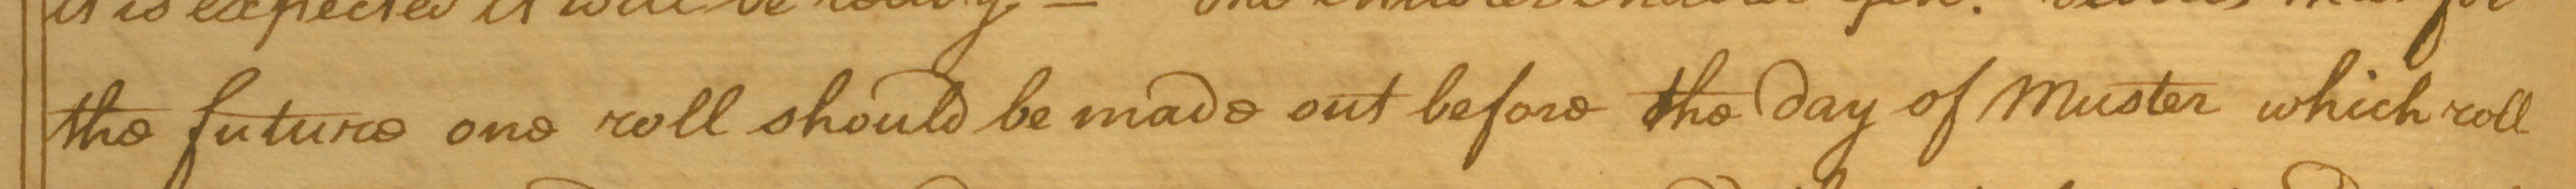the future one roll should be made out before the day of Muster which roll
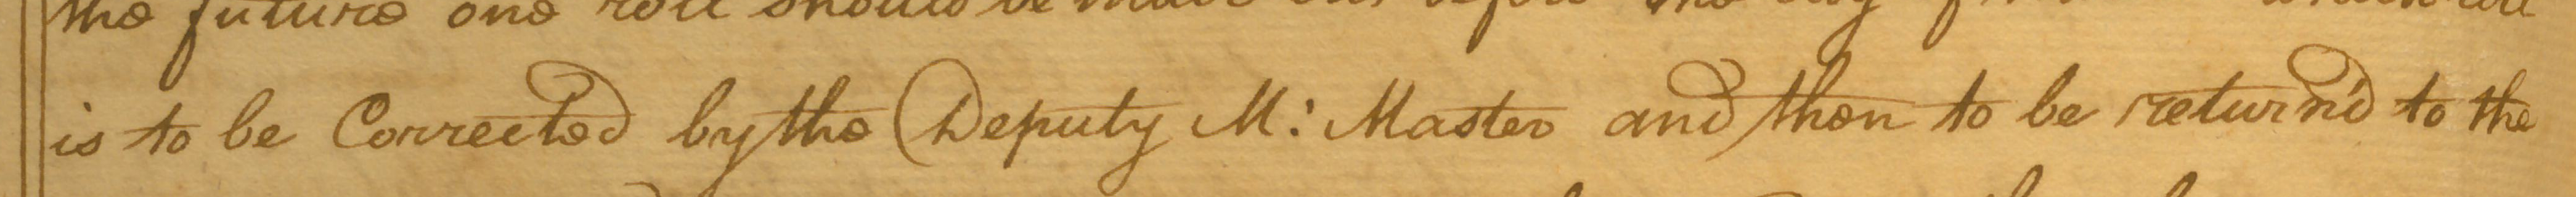is to be Corrected by the Deputy M: Master and then to be return'd to the
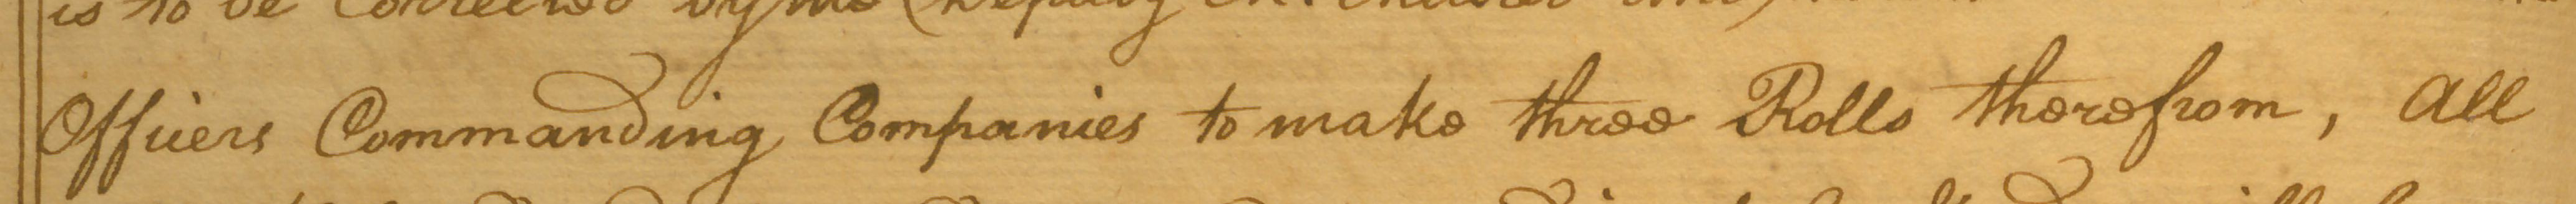Officers Commanding Companies to make three Rolls therefrom, All
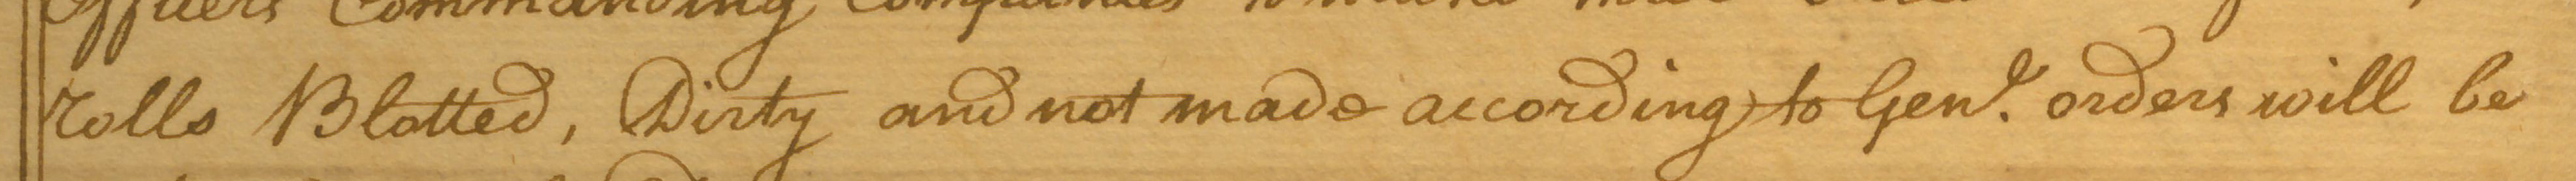rolls Blotted, Dirty and not made according to Gen^l. orders will be
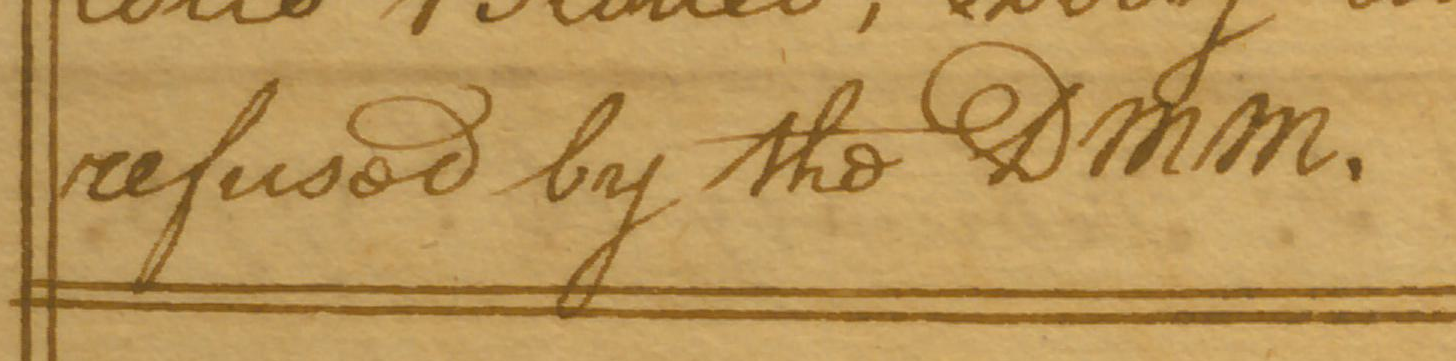refused by the DMM.
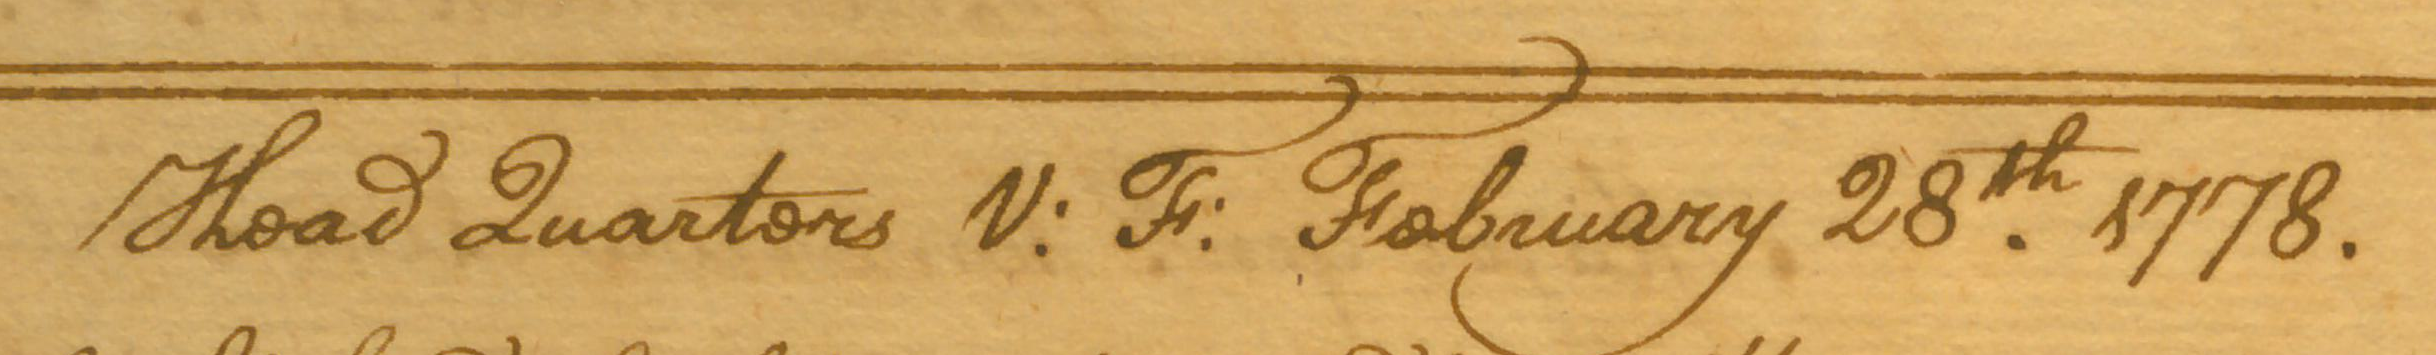Head Quarters V: F: February 28^th. 1778.
